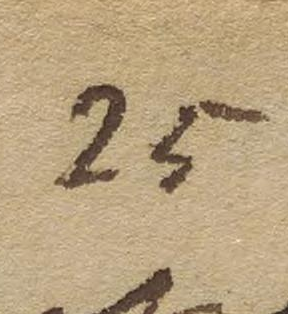25
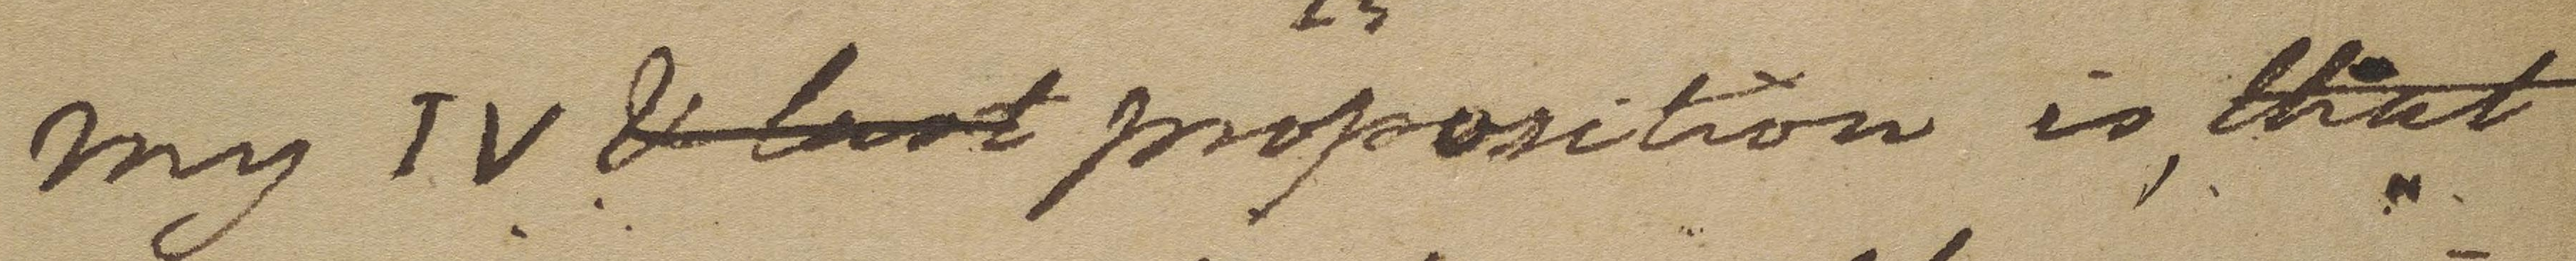My IV [& last] proposition is that
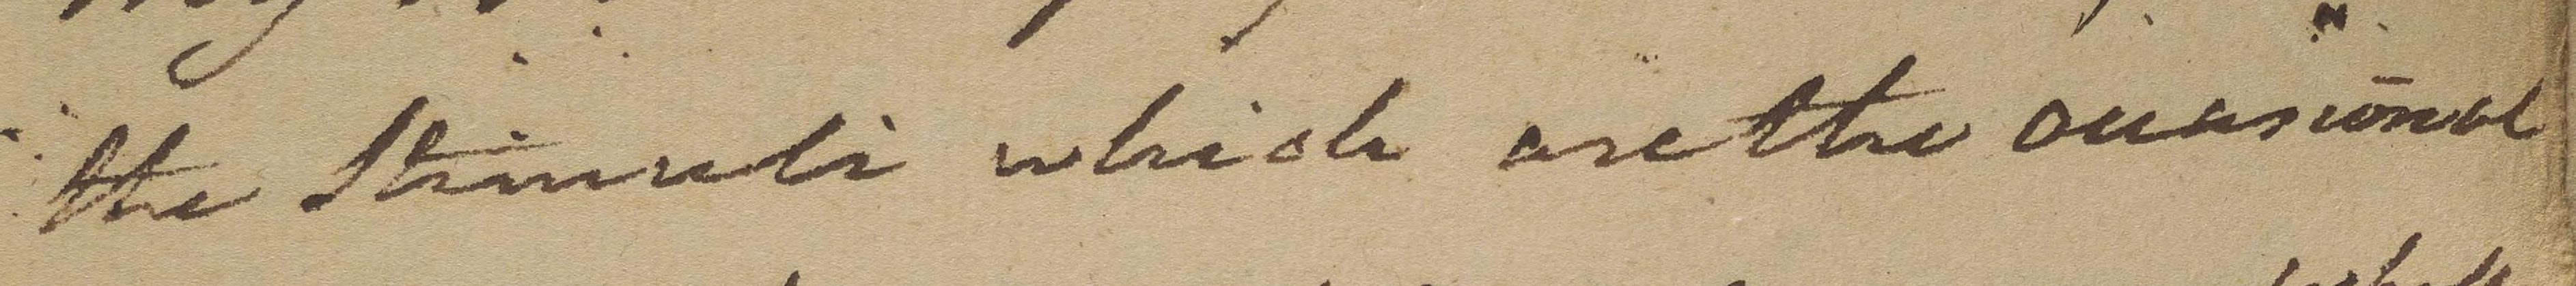the stimuli which are the occasional
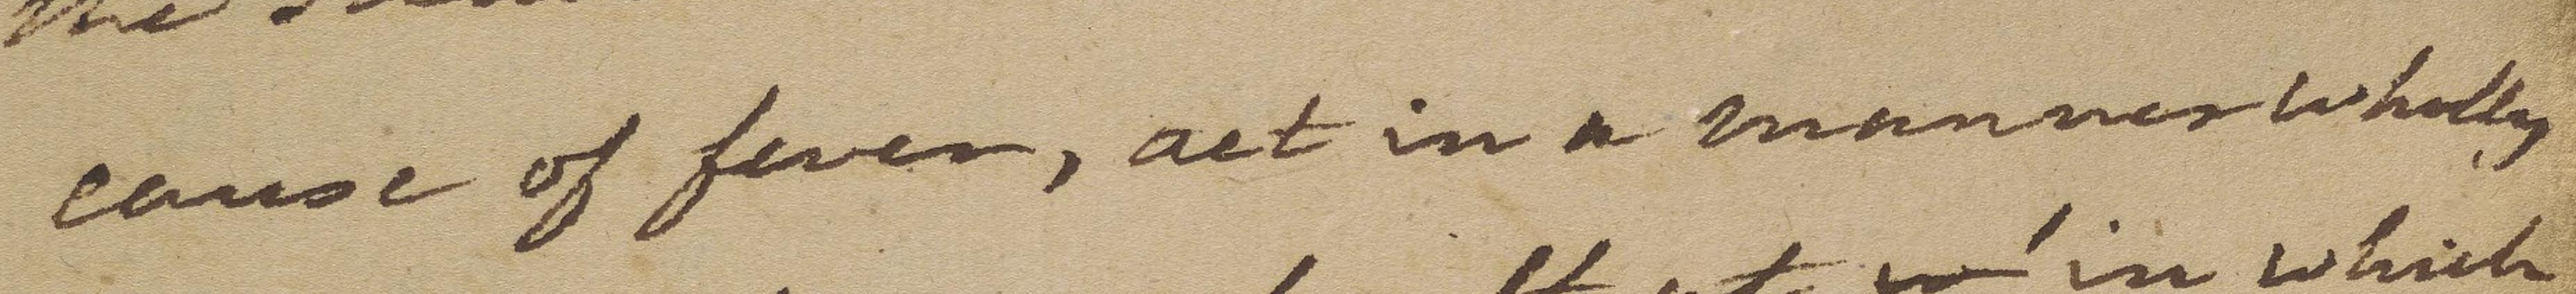cause of fever, act in a manner wholly
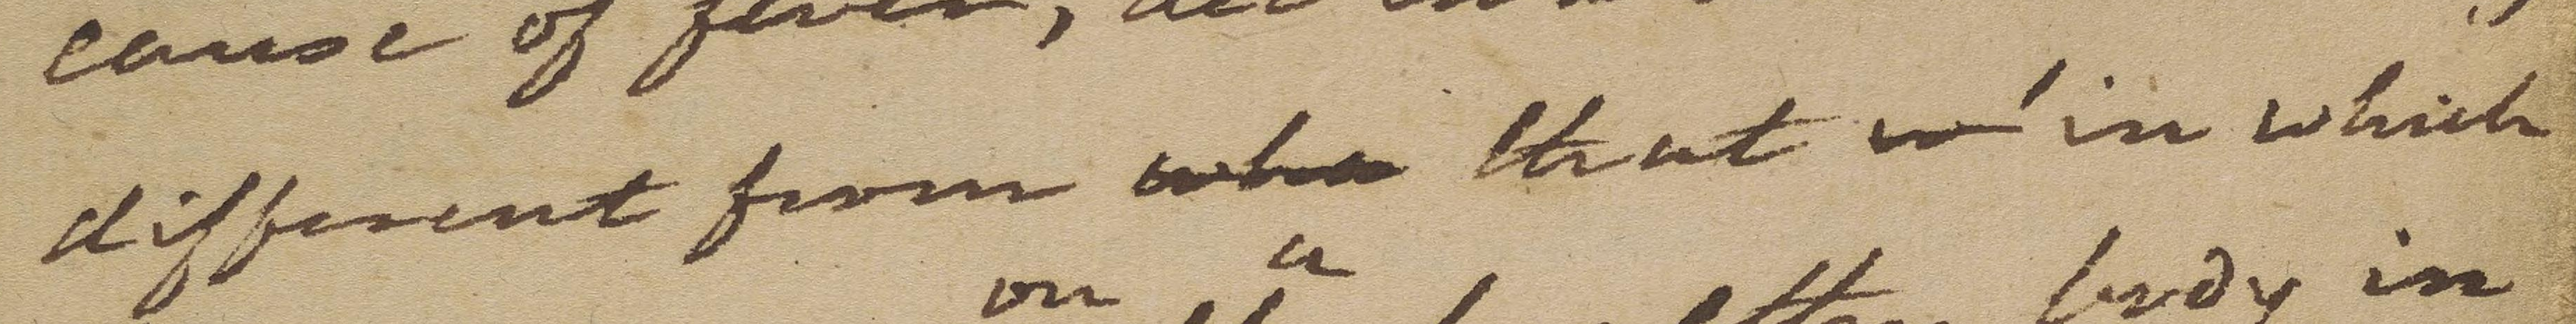different from [which] that w'in which
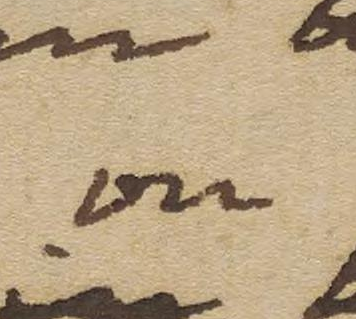on
